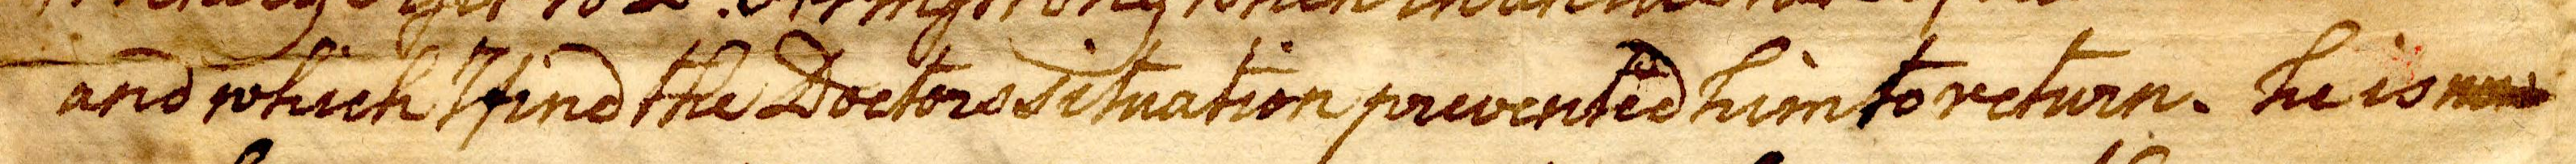and which I find the Doctors situation prevented him to return. he is [now]
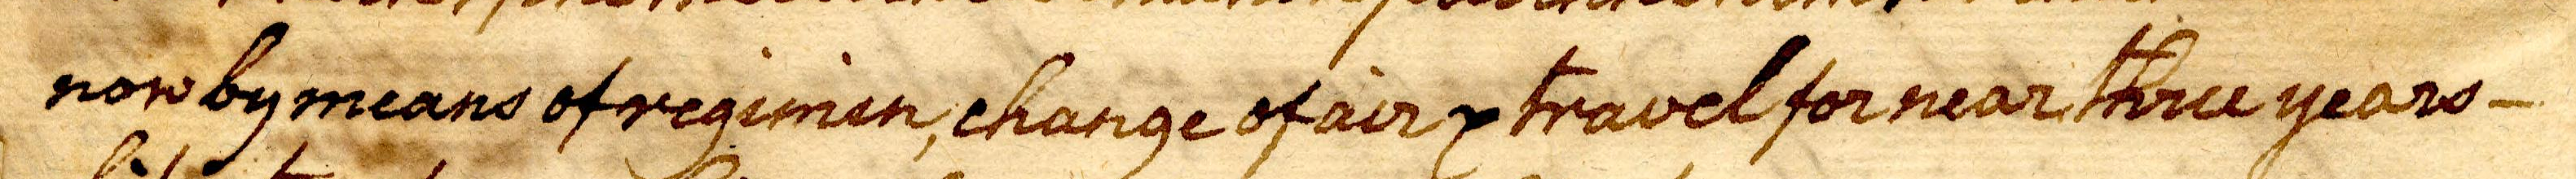now by means of regimin, change of air & travel for near three years-
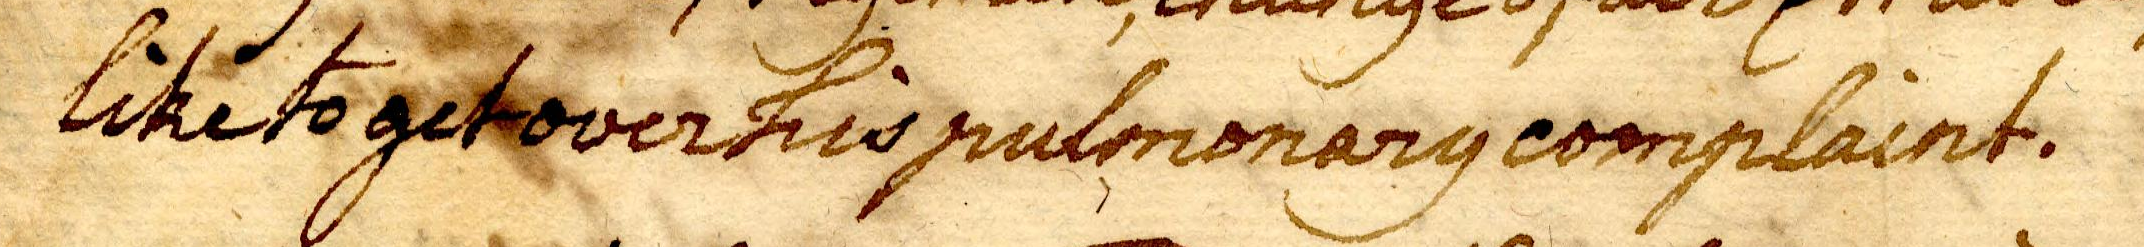like to get over his pulmonary complaint.
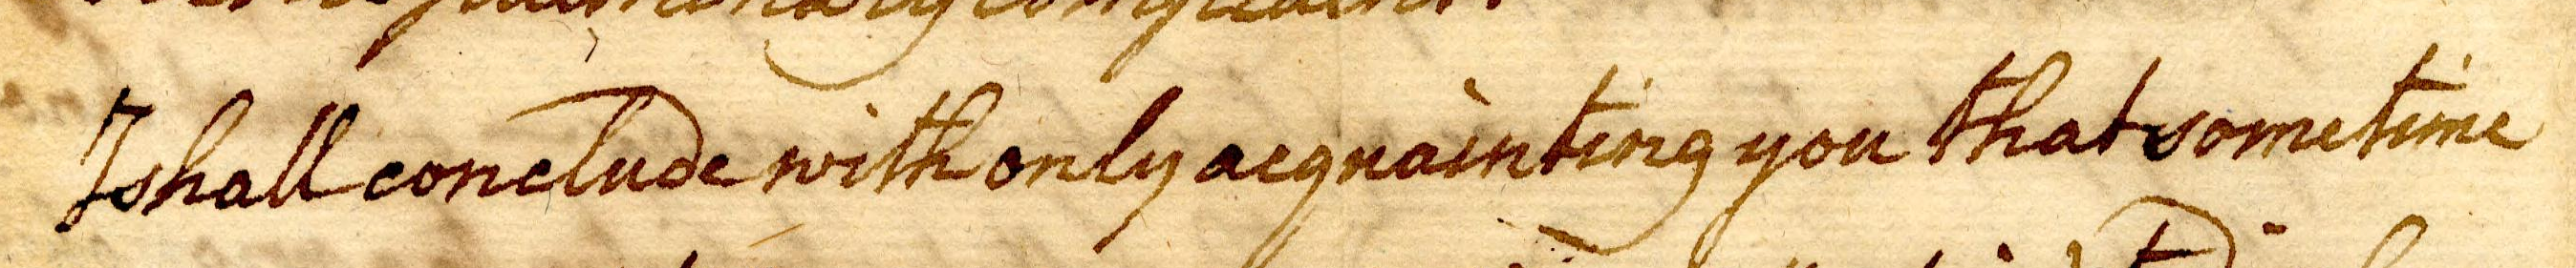I shall conclude with only acquainting you that sometime
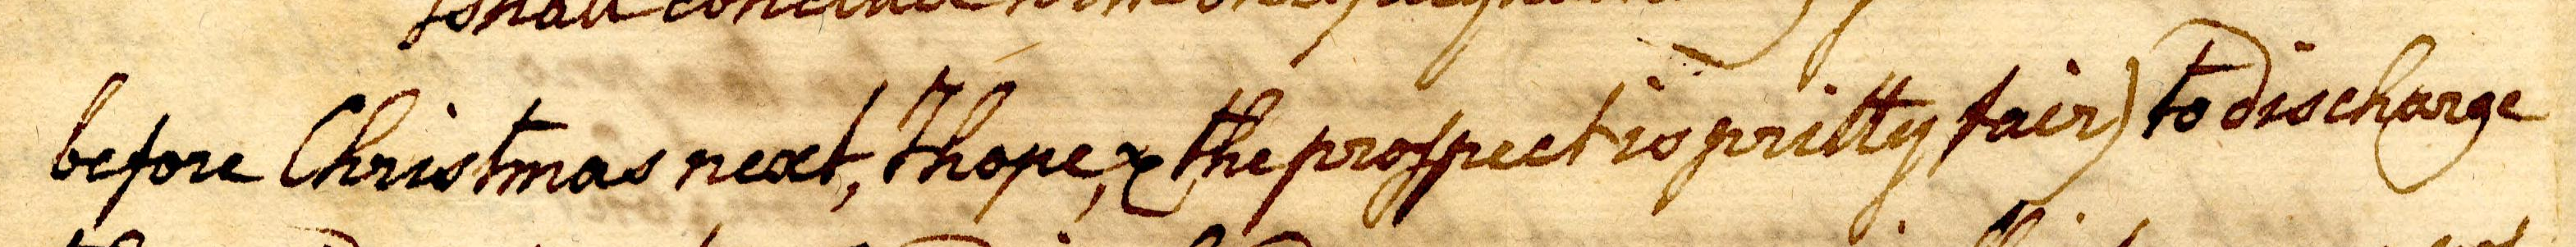before Christmas next, I hope, & the prospect is pritty fair) to discharge
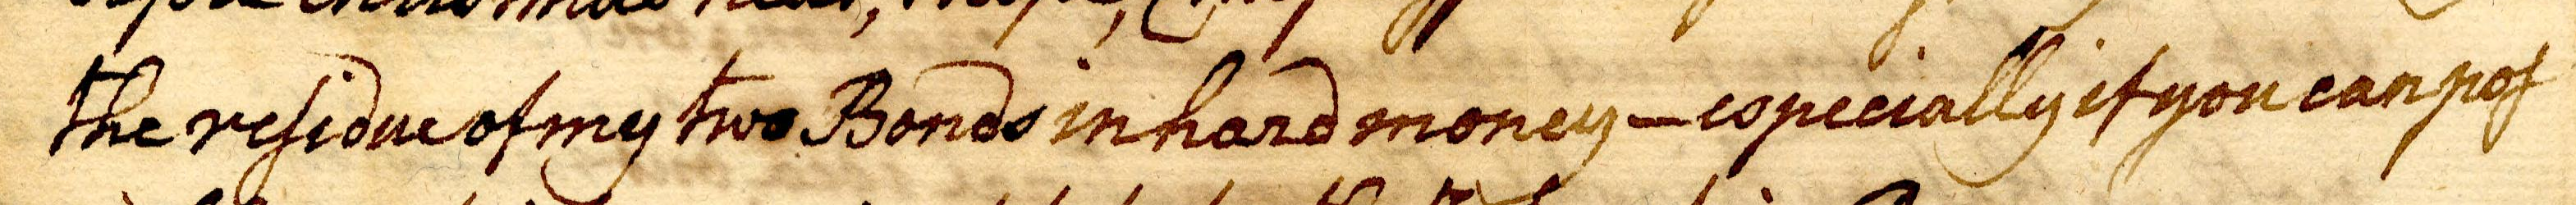the residue of my two Bonds in hard money- especially if you can pos
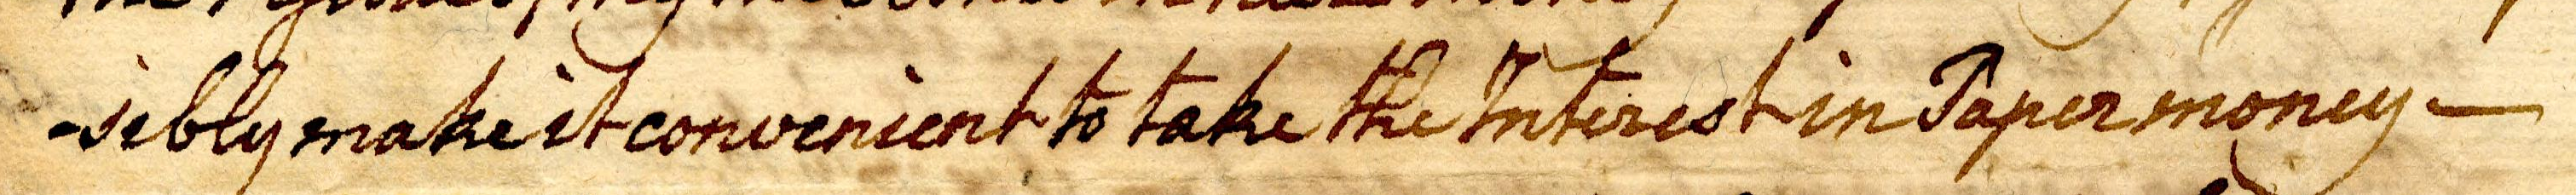-sibly make it convenient to take the Interest in Paper money-
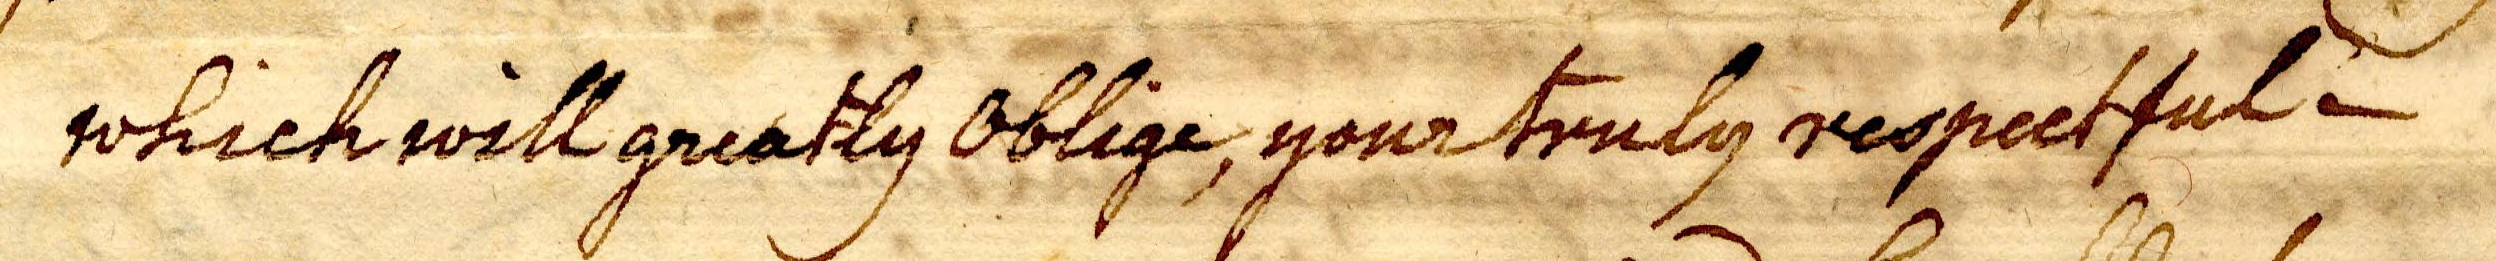which will greatly oblige, your truly respectful-
